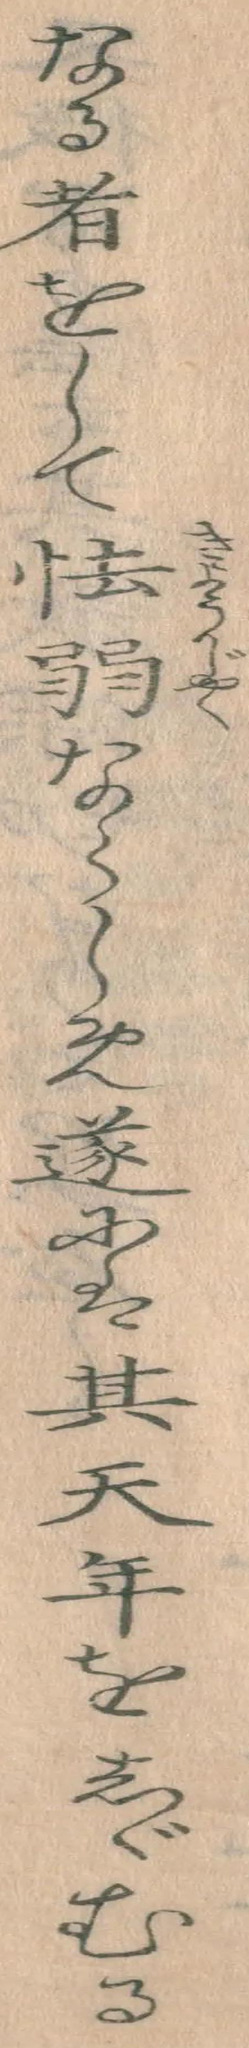なる者をして怯弱ならしめ遂には其天年をしゞむる
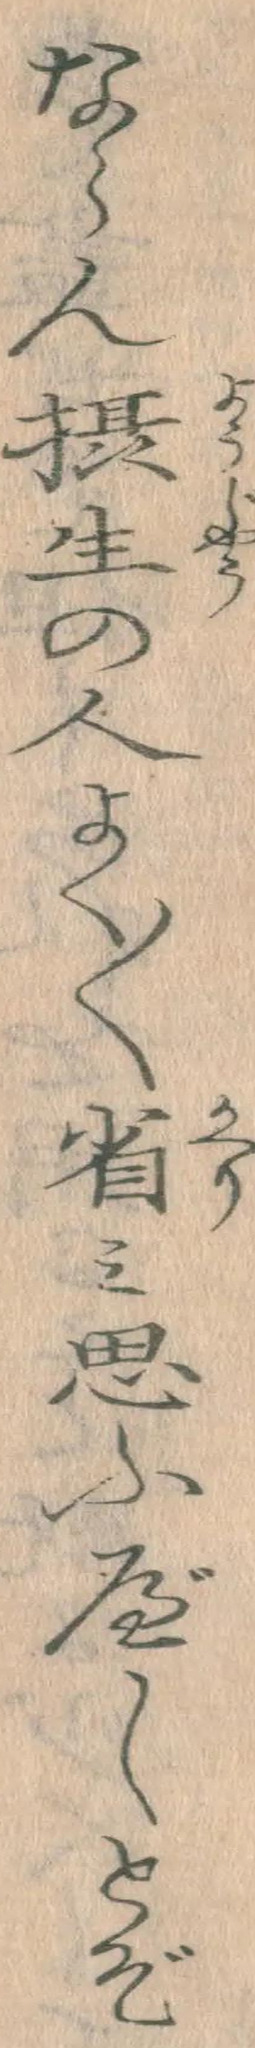ならん摂生の人よく〳〵省み思ふべしとぞ
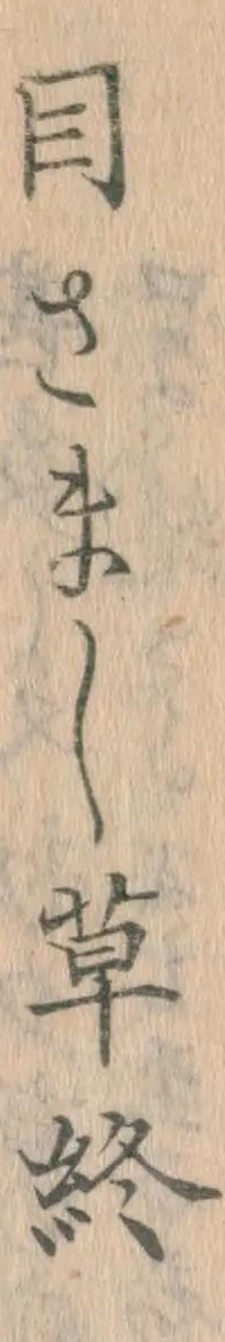目さまし草終
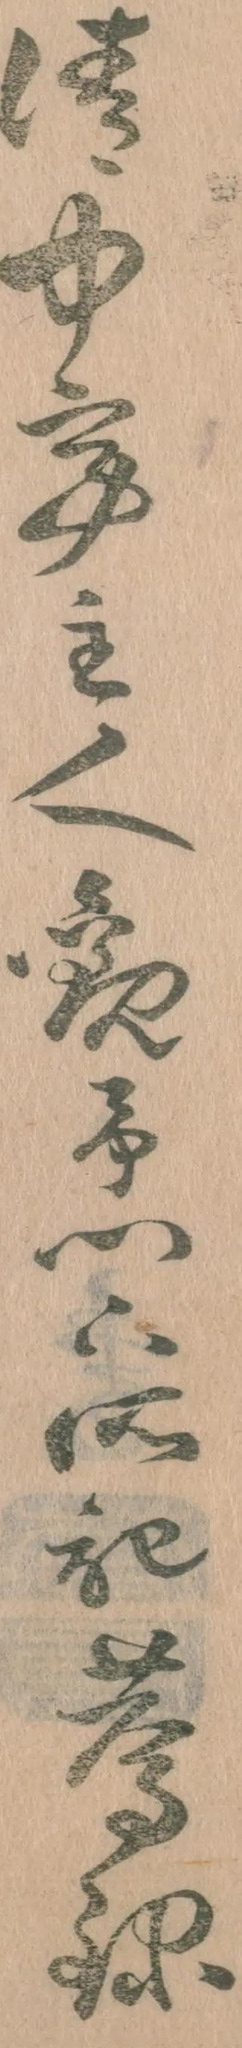清中亭主人観予下所記蔫録
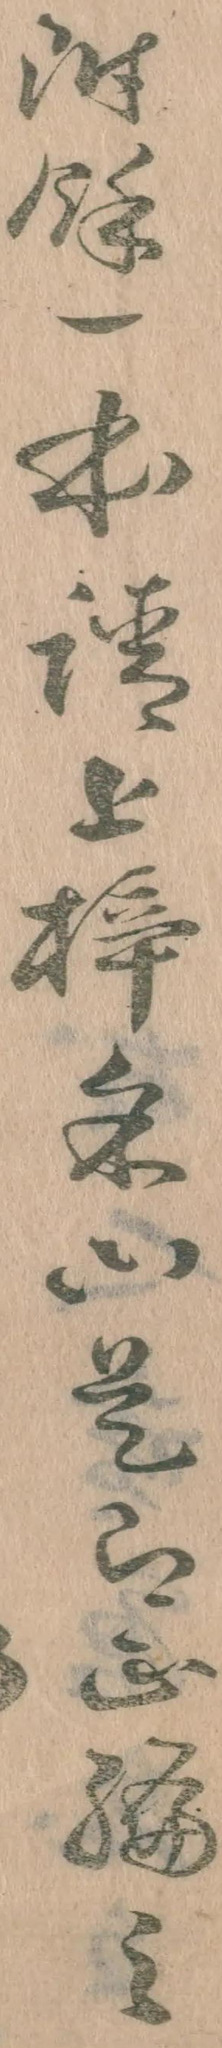附余一本請上梓名以是有正編之
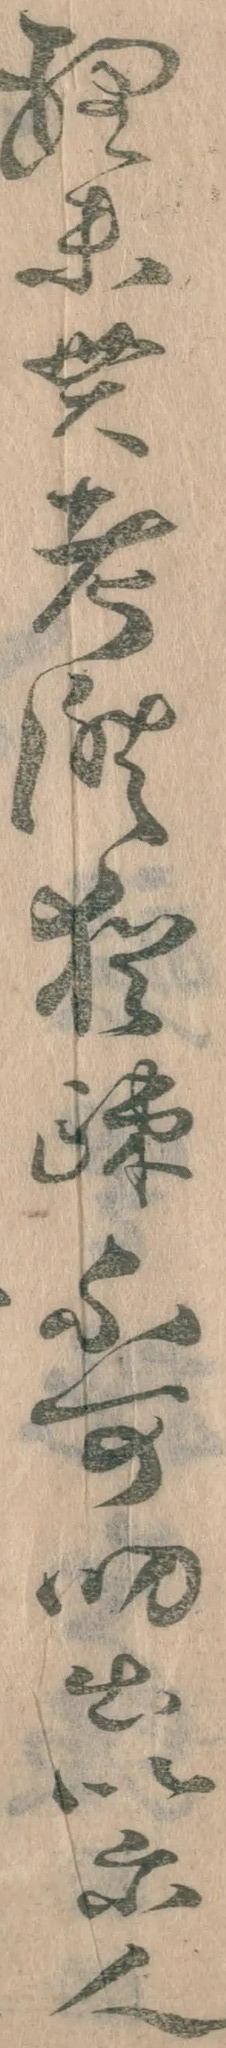理未貫考証猶疎不可助出以人

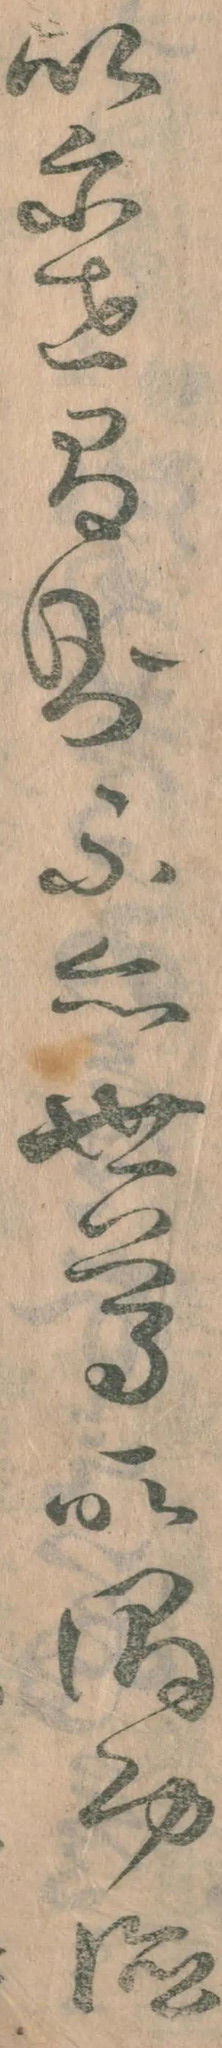以世間則不亦世尊所謂功徳
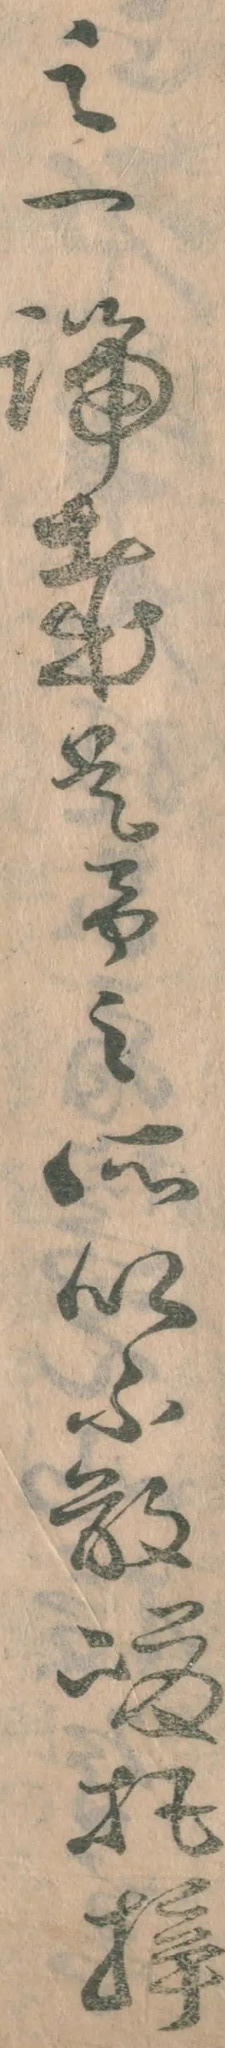之一端哉是予之所以不散峻把梓
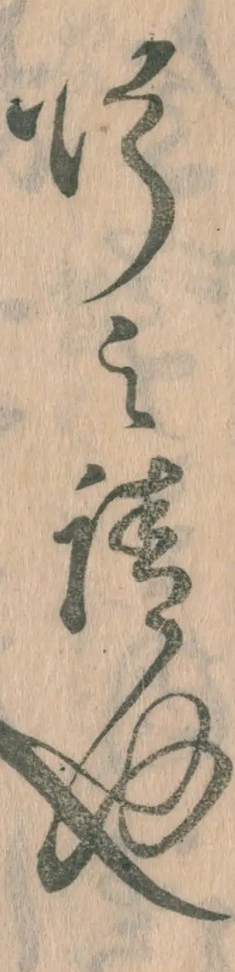行之請也
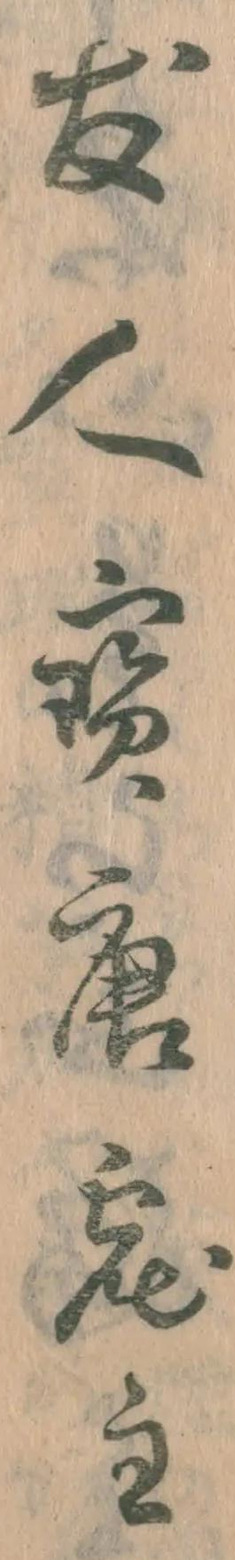友人宝唐窟主
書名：目さまし草
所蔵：国立国会図書館 National Diet Library, JAPAN
